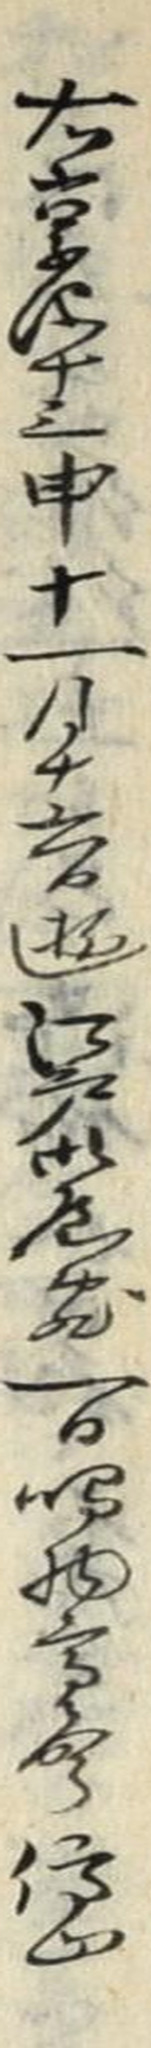右享保十三申十一月十六日逝江戸御屋敷一日鳴物高声停止
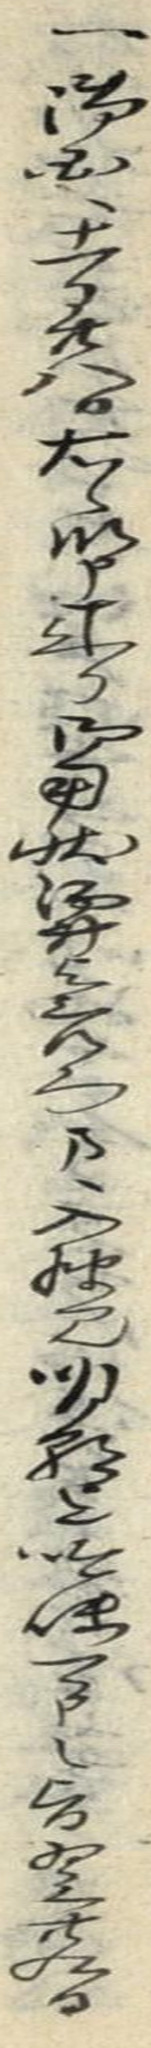一御国へ十一月廿八日右之段申来り御用状酒井与三左衛門方へ入披見明朝迄吟味可申之旨翌廿九日
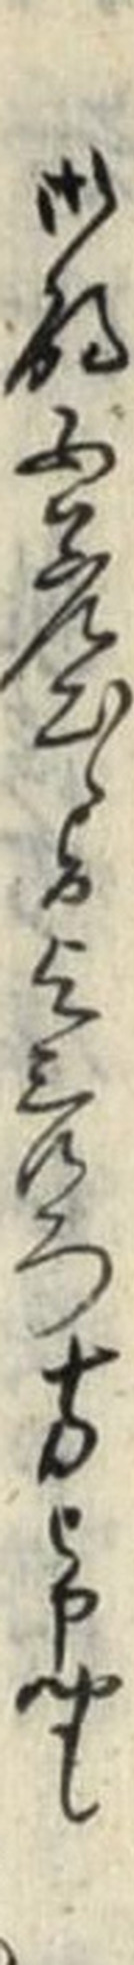御触不差出候旨与三左衛門方被申聞候
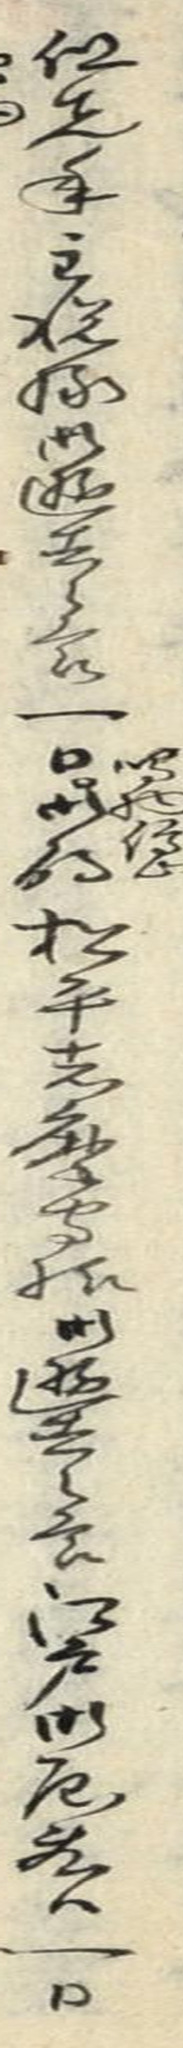但先年主税様御逝去之節一日御触松平志摩守様御逝去之節江戸御屋敷は一日
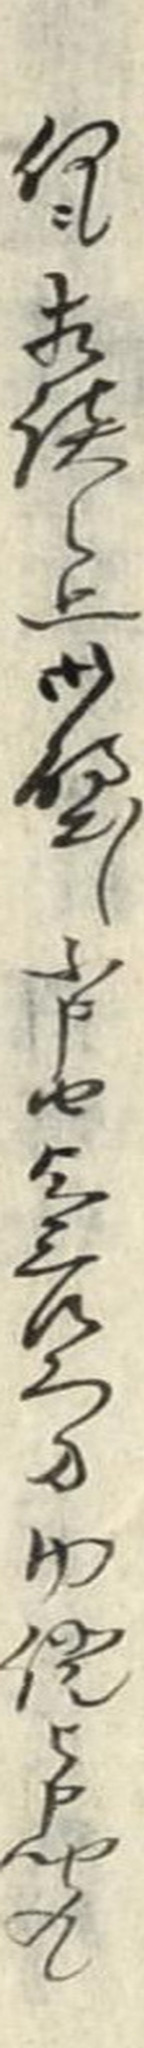何も相談之上御触出し不申由与三左衛門方内証被申聞候
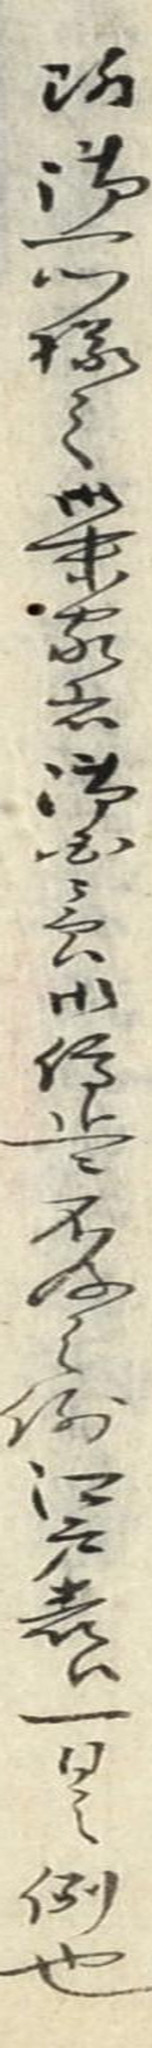附御一門様之御末家は御国にては御停止に不及之例江戸表は一日之例也
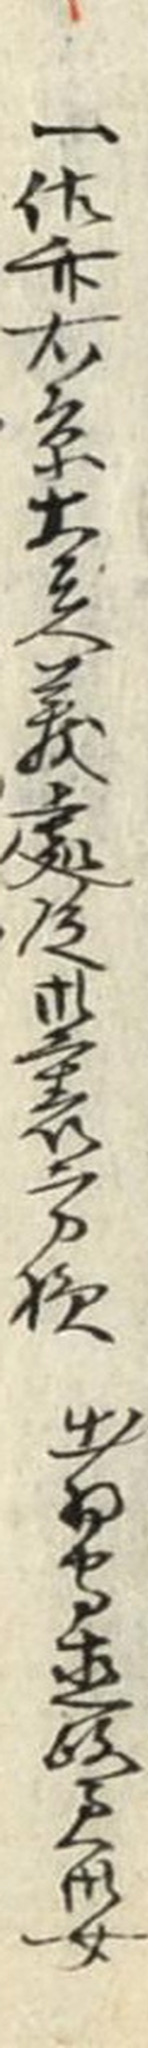一佐竹右京大夫義処殿御裏方様出羽守直政君御女
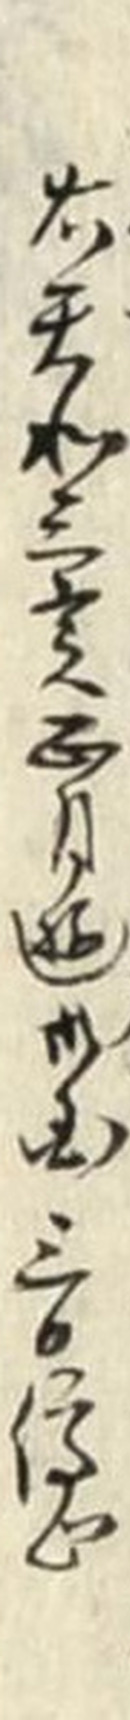右天和三亥正月逝御国三日停止
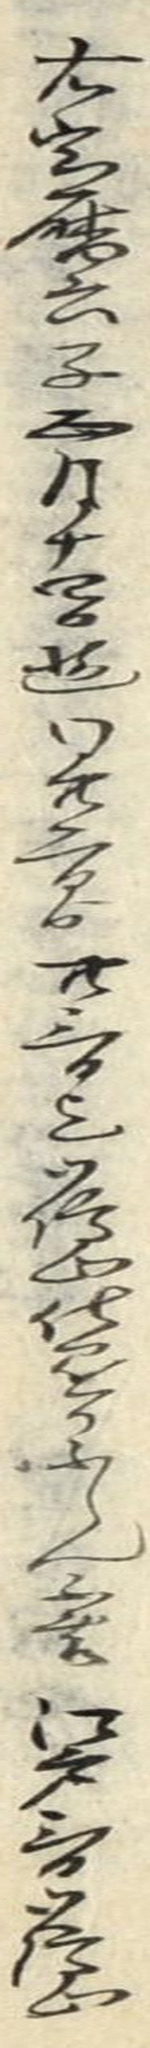右宝暦六子正月十四日逝同廿二日ゟ廿三日迄御停止仕懸りふしん不苦江戸三日御停止

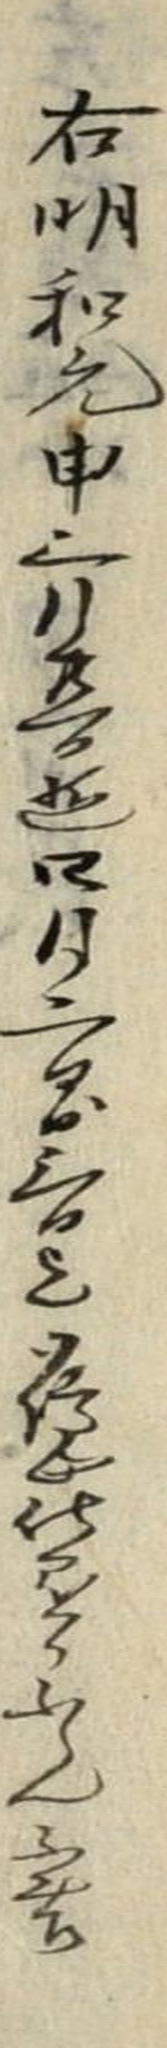右明和元申三月廿一日逝四月二日ゟ三日迄御停止仕懸りふしん不苦
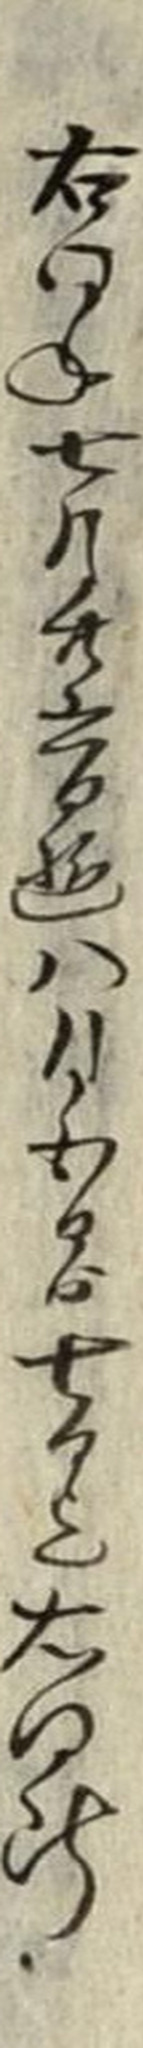右同年七月廿六日逝八月五日ゟ七日迄右同断
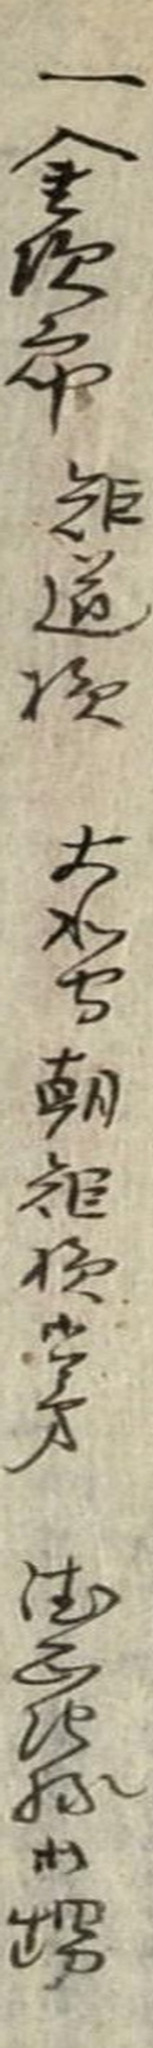一金次郎矩道様大和守朝矩様御弟徳正院様御甥
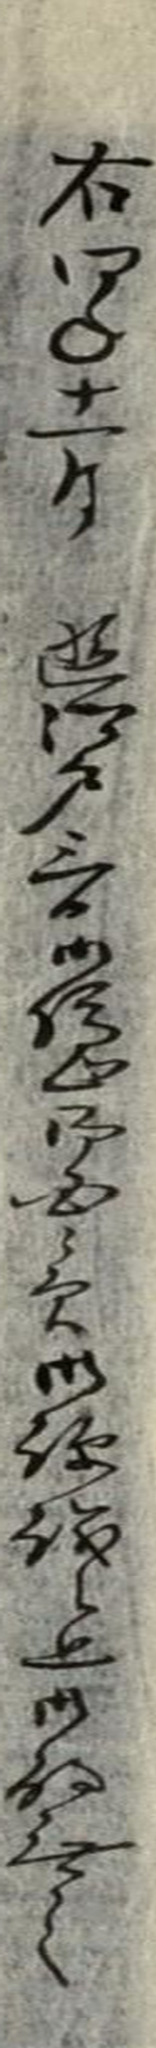右同年十一月逝江戸三日御停止御国にては御評議之上御触無之
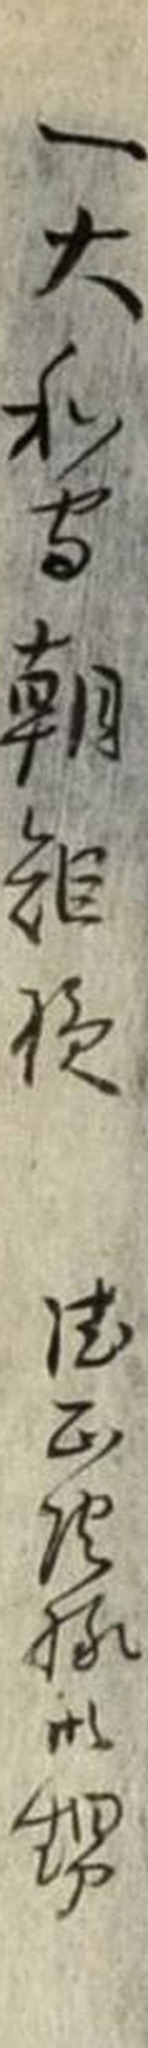一大和守朝矩様徳正院様御甥
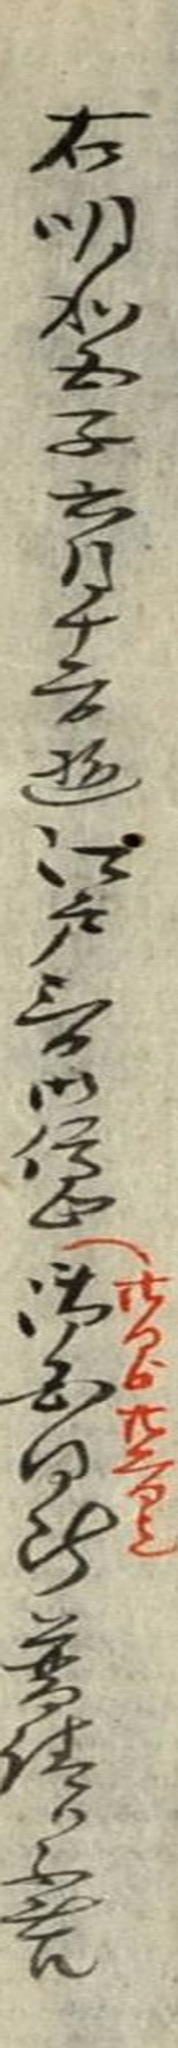右明和五子六月十二日逝江戸三日御停止御国同断普請は不苦
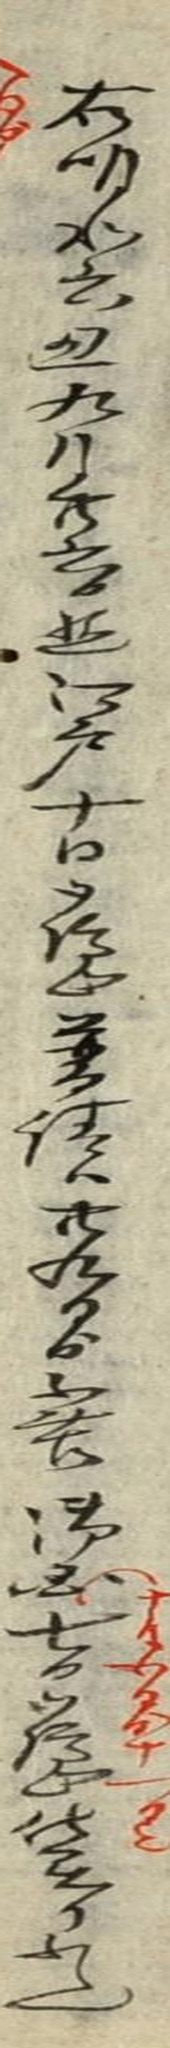右明和六丑九月廿六日逝江戸十日御停止普請は廿九日ゟ不苦御国七日御停止仕懸りふしん
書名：御停止異変死失
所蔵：福井県文書館 Fukui Prefectural Archives
